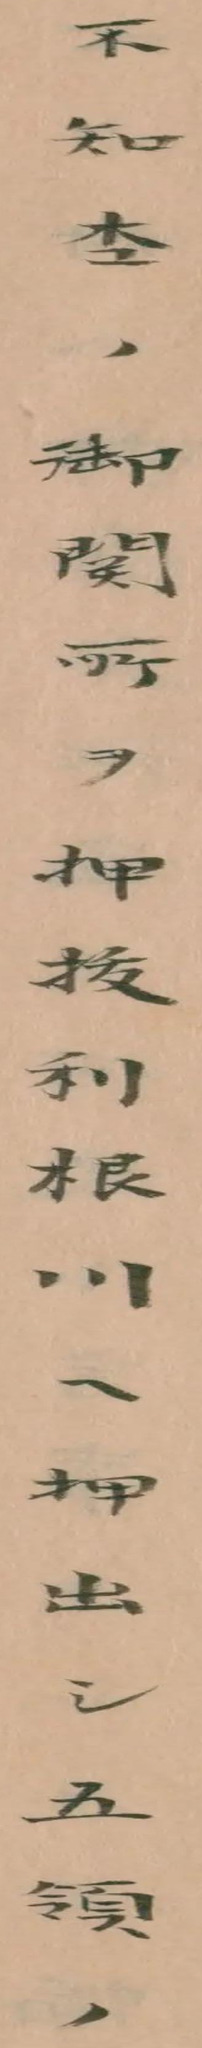不知杢ノ御関所ヲ押抜利根川へ押出シ五領ノ
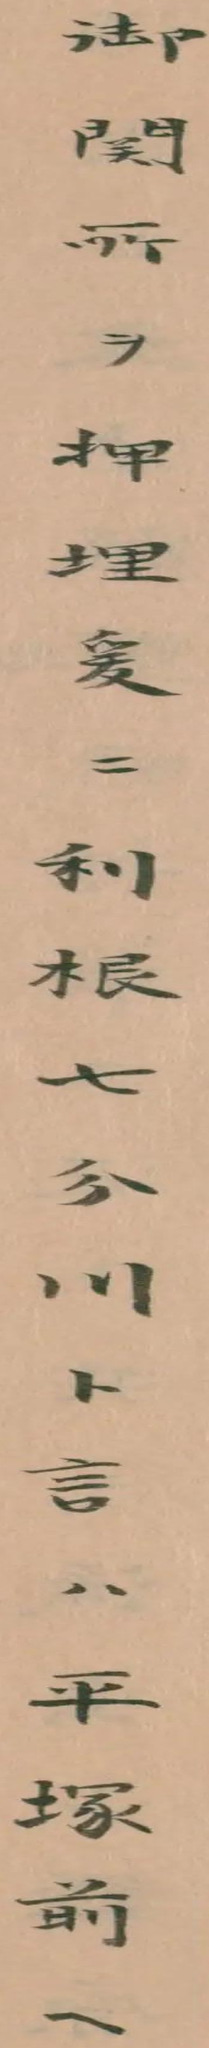御関所ヲ押埋爰二利根七分川ト言ハ平塚前へ
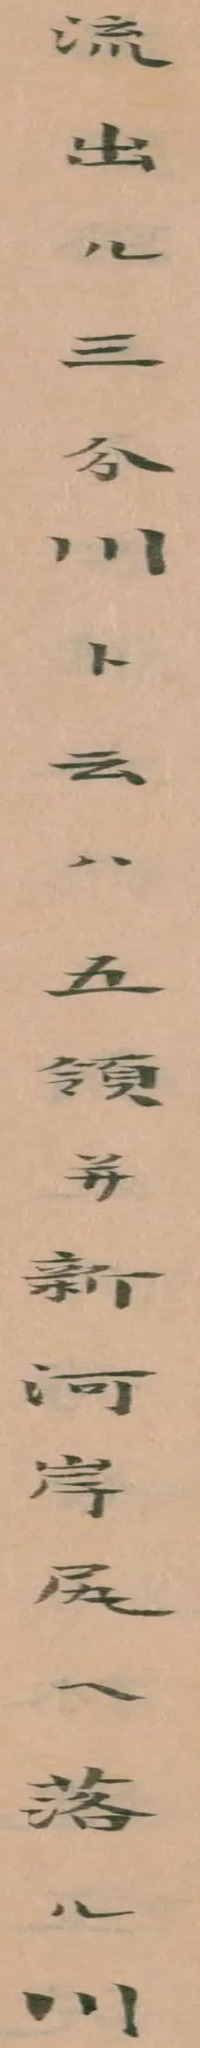流出ㇽ三分川ト云ハ五領并新河岸尻へ落ル川
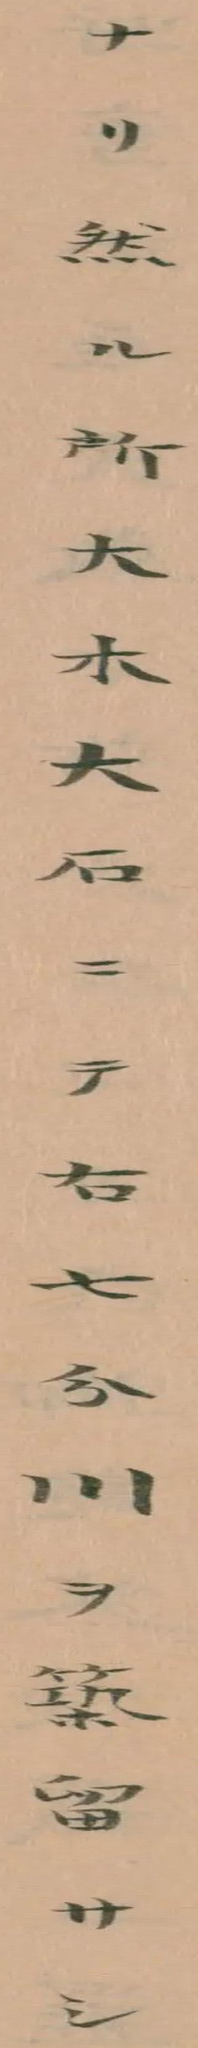ナリ然ル所大木大石ニテ右七分川ヲ築留サシ
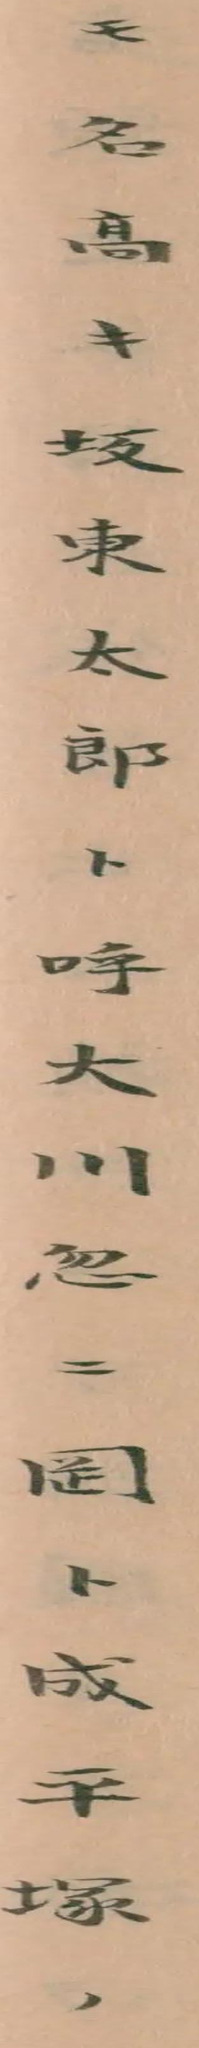モ名高キ坂東太郎ト呼大川忽二岡ト成平塚ノ
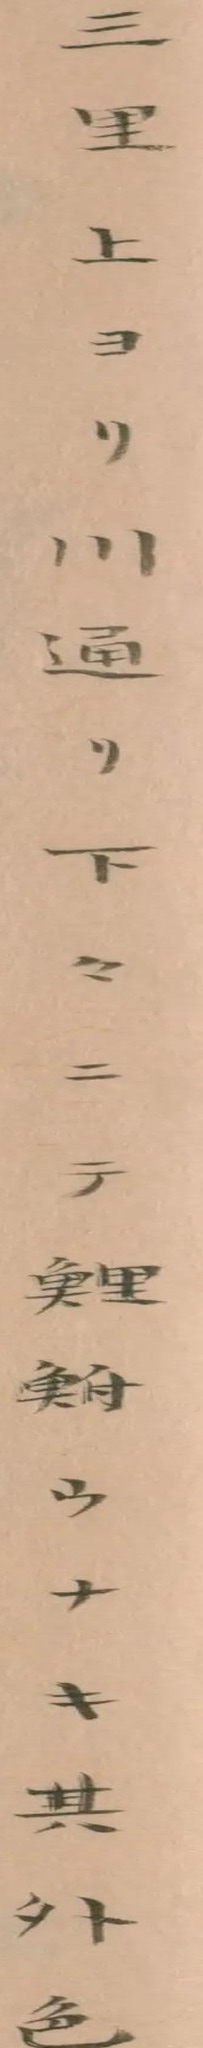三里上ヨリ川通り下々ニテ鯉鮒ウナキ其外色
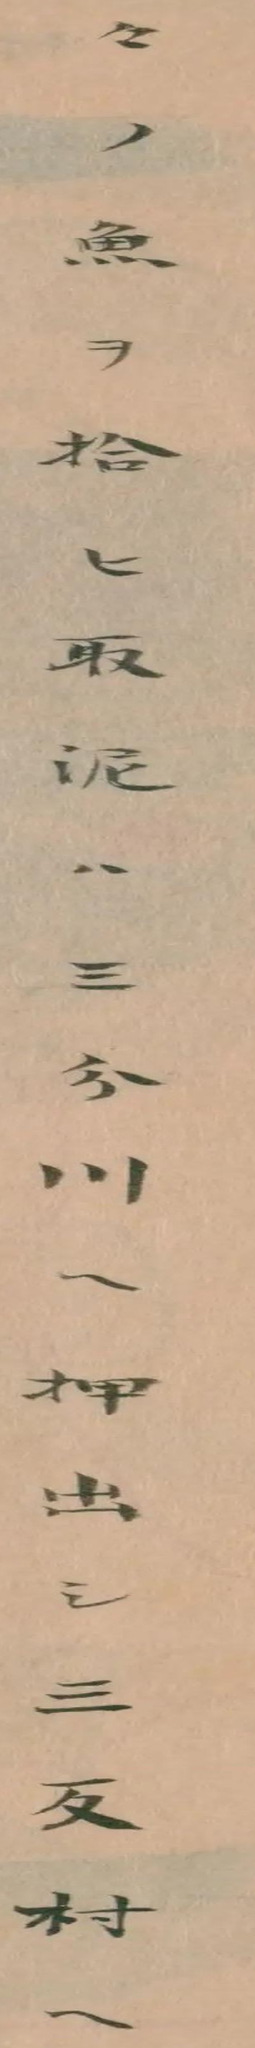々ノ魚ヲ拾ヒ取泥ハ三分川へ押出シ三反村へ
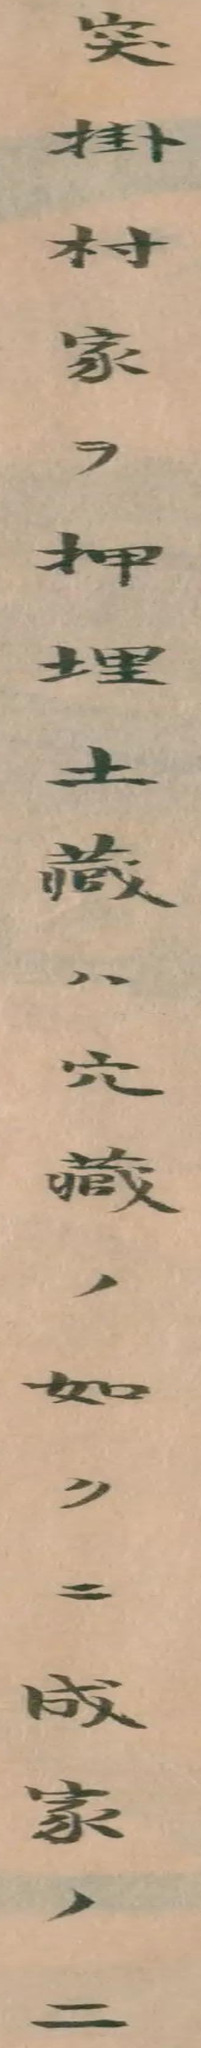突掛村ヲ押埋土蔵ハ穴蔵ノ如くクニ成家ノ二
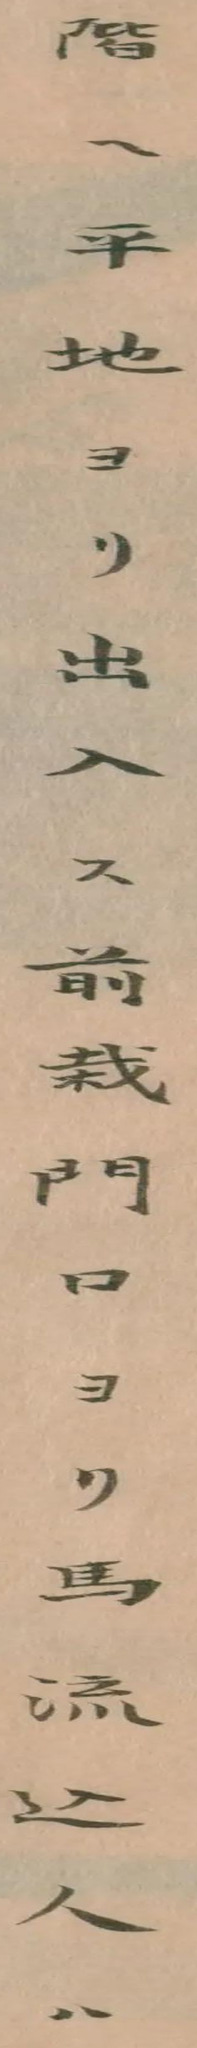階へ平地ヨリ出入ス前栽門口ヨリ馬流込人ハ
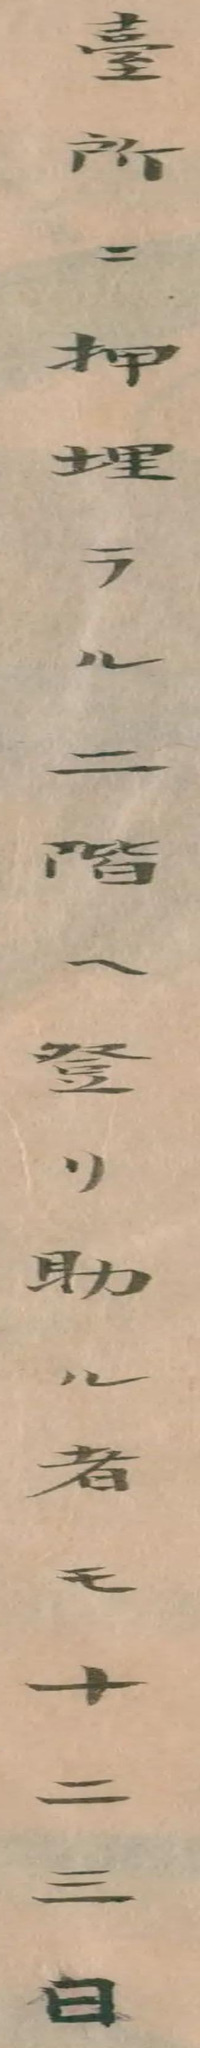台所二押埋ラㇽ二階へ登り助ル者モ十二三日
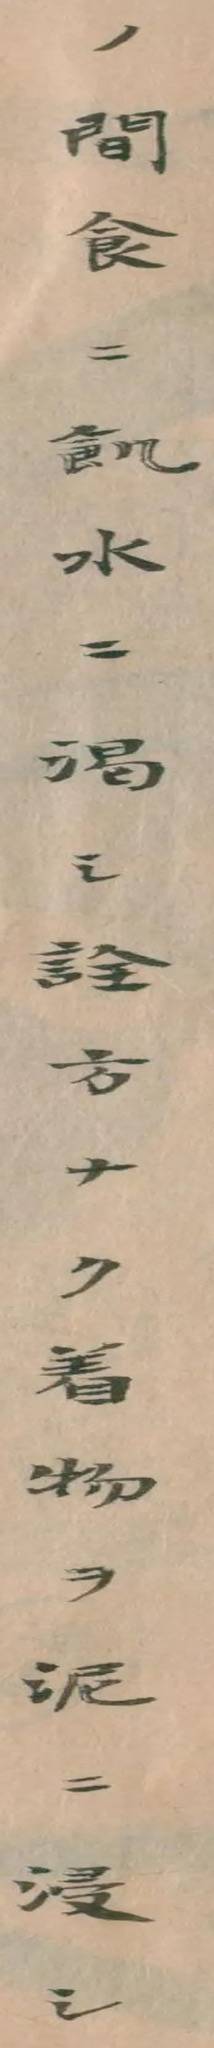ノ間食二飢水二渇シ詮方ナク着物ヲ泥二浸シ
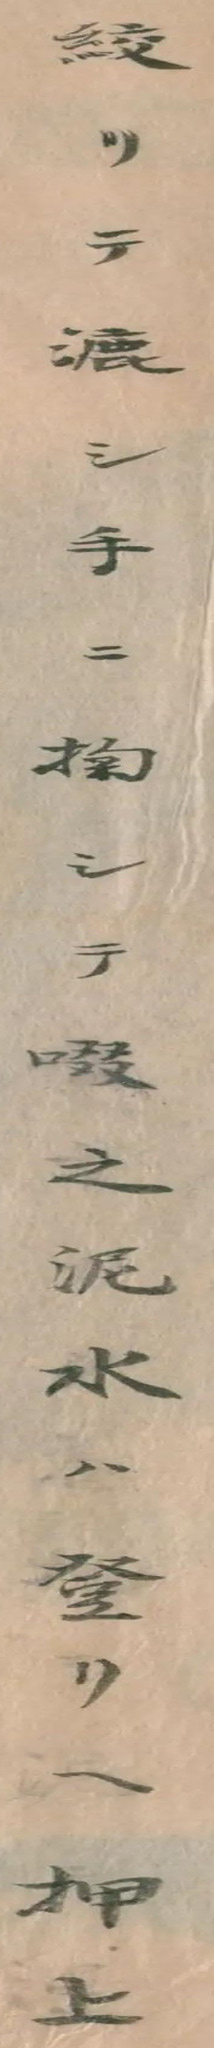絞りテ漉シ手二掬シテ啜之泥水ハ登りへ押上
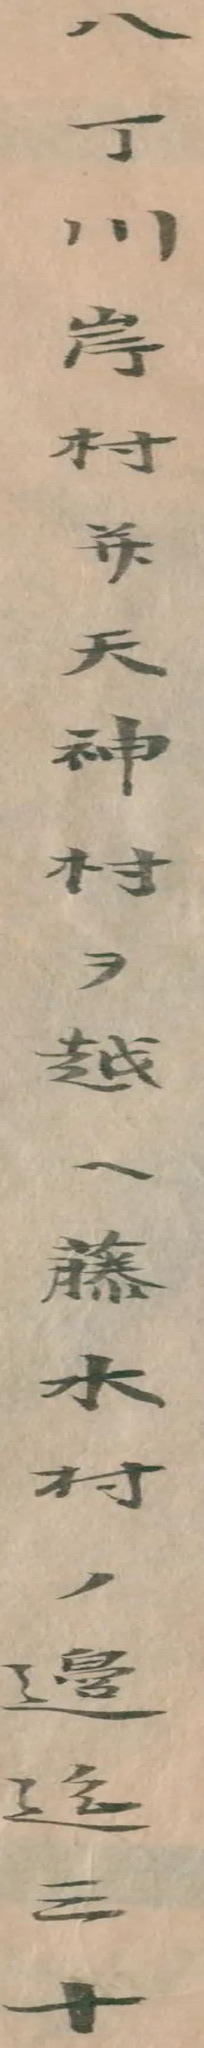八丁川岸村并天神村ヲ越へ藤木村ノ辺迄三十
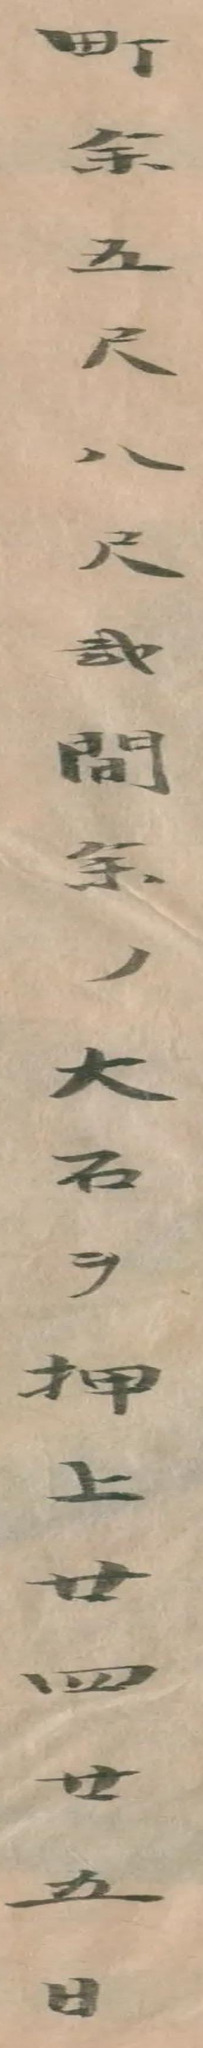町余五尺八尺弐間余ノ大石ヲ押上廿四廿五日
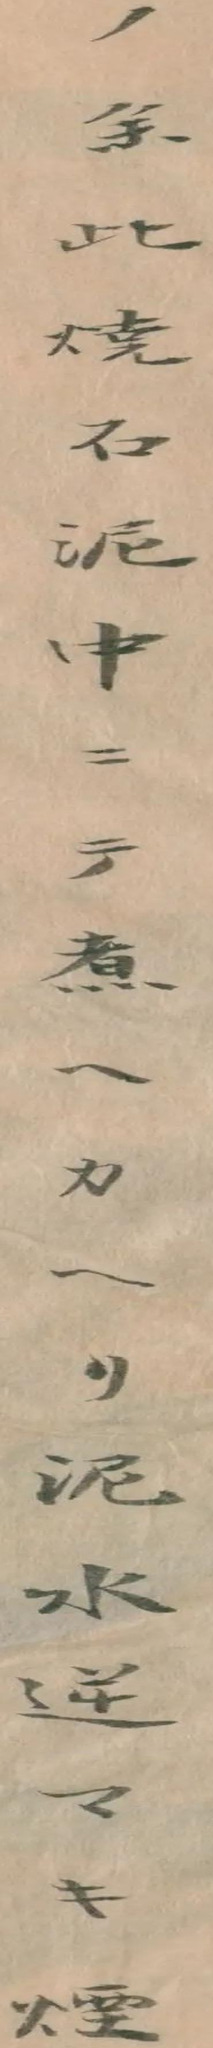ノ余此焼石泥中ニテ煮へカヘリ泥水逆マキ煙

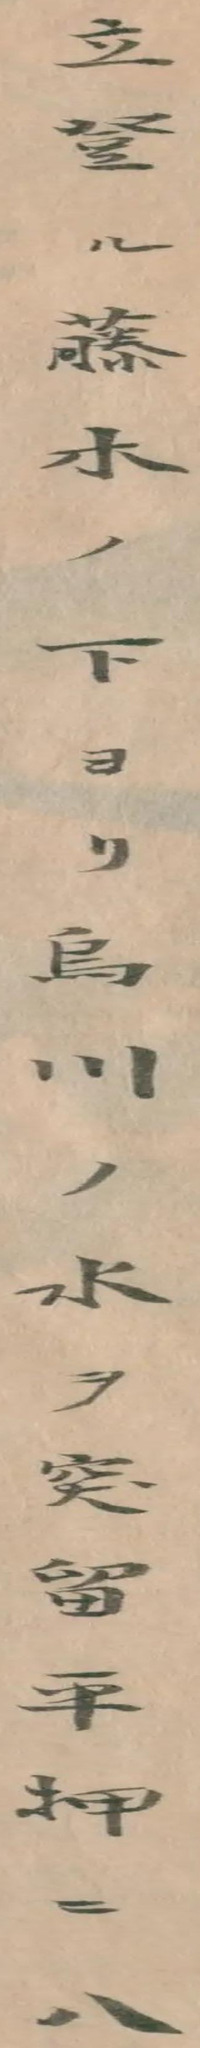立登ル藤木ノ下ヨリ烏川ノ水ヲ突留平押二八
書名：地災撮要. 巻3(地震之部)-巻4(噴火之部)
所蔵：国立国会図書館 National Diet Library, JAPAN
